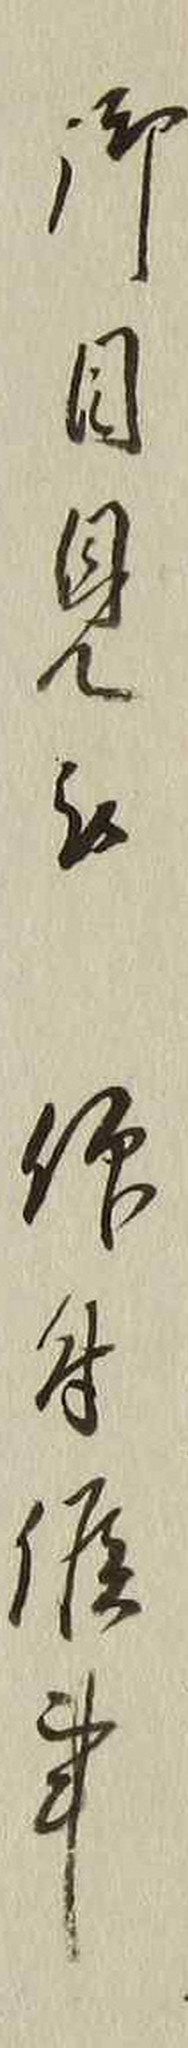御目見被仰付候事
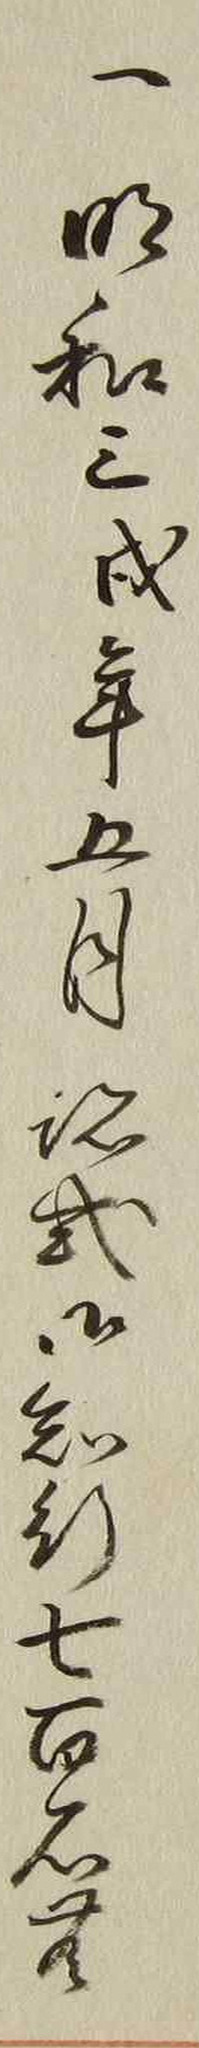一明和三戌年五月跡式御知行七百石無
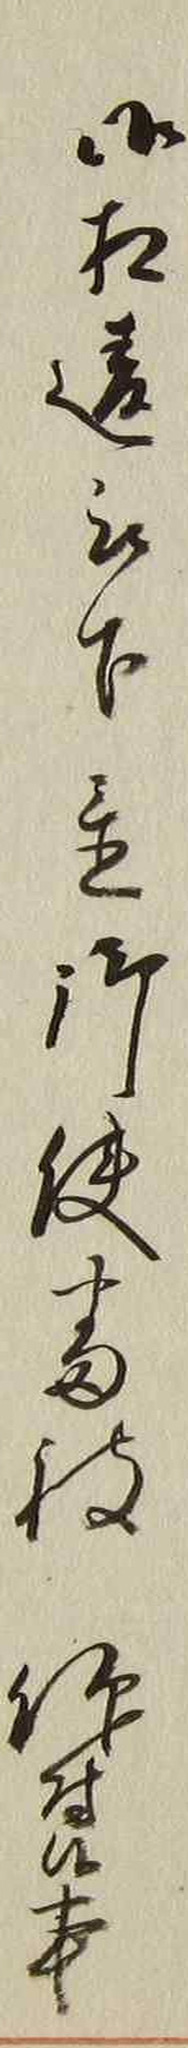御相違被下置御使番被仰付候事
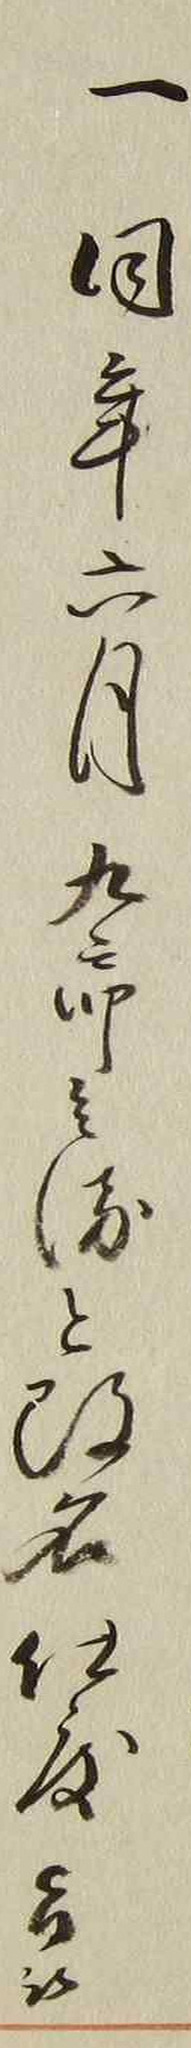一同年六月九郎兵衛与改名仕度旨被
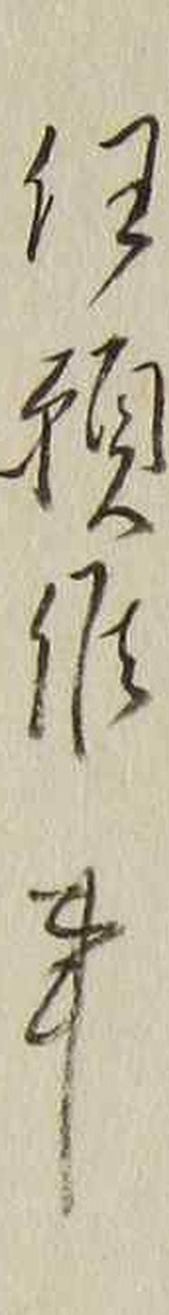任願候事
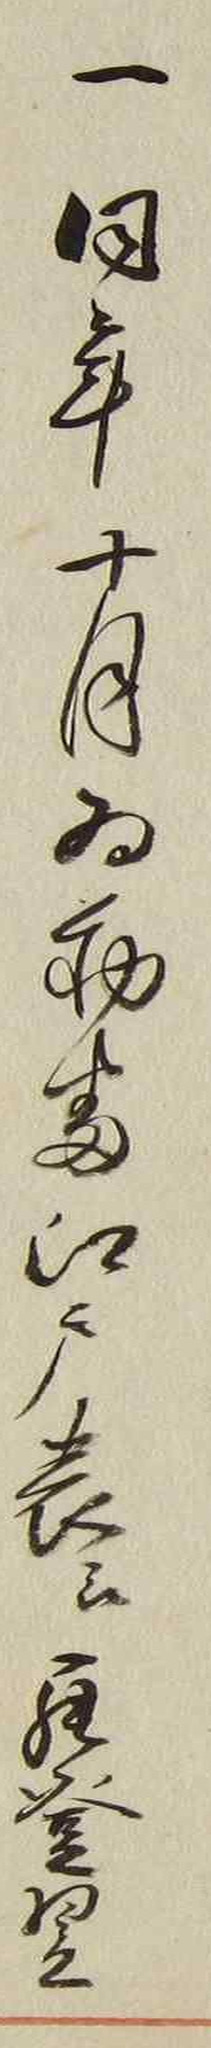一同年十月為勤番江戸表江罷登翌
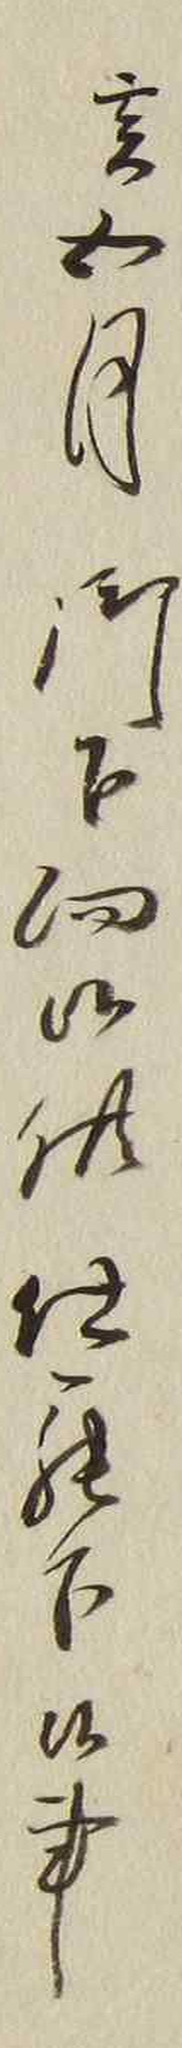亥五月御下向御供仕罷下候事

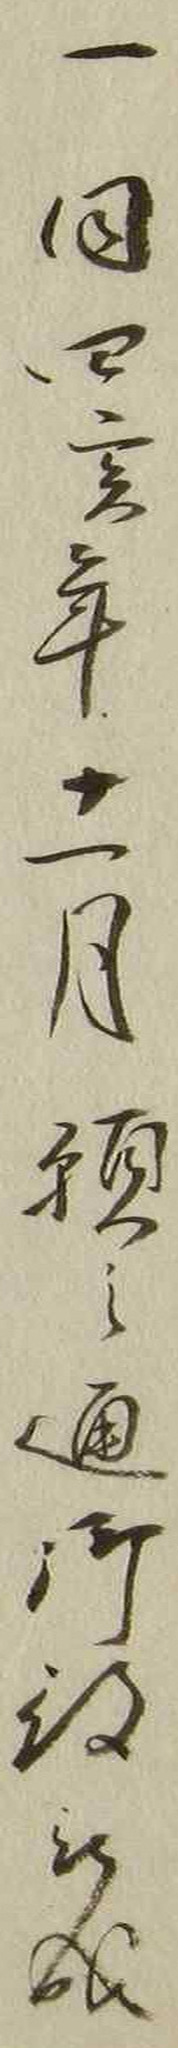一同四亥年十一月願之通御役被成
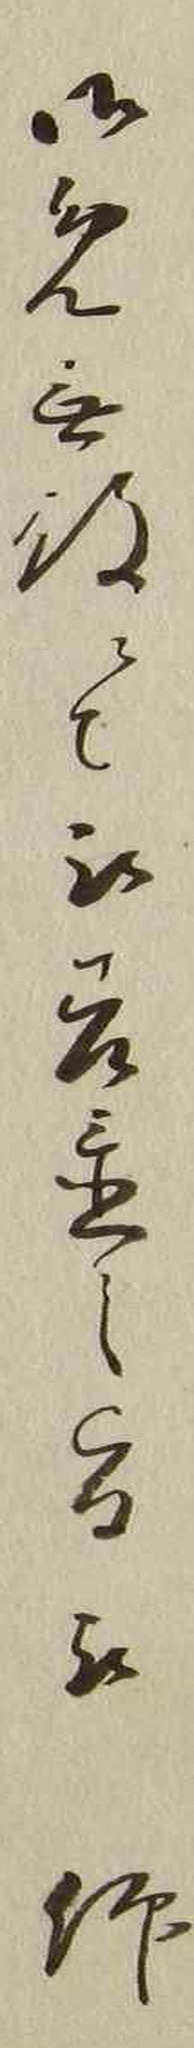御免無役ニて被差置候旨被仰
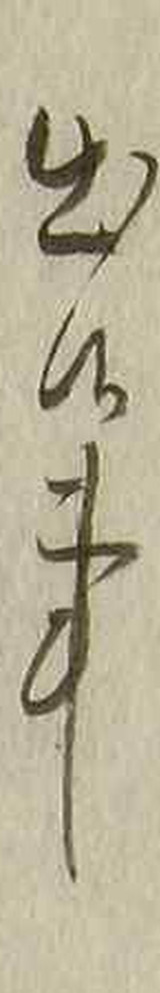出候事
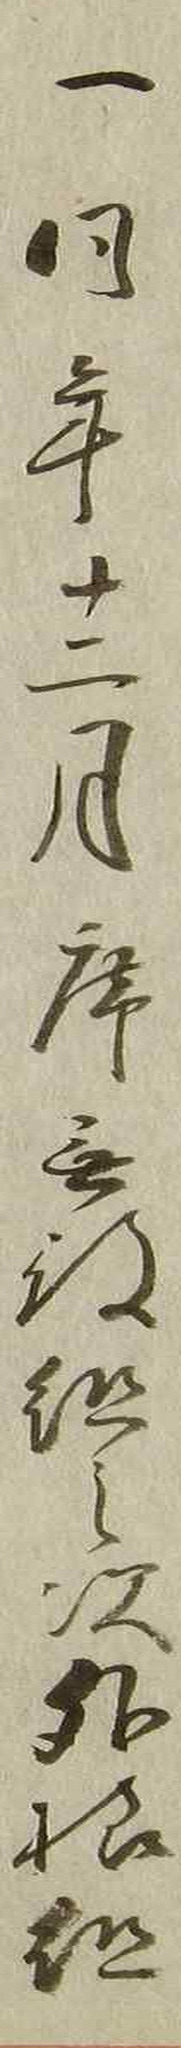一同年十二月席無役組之次外様組
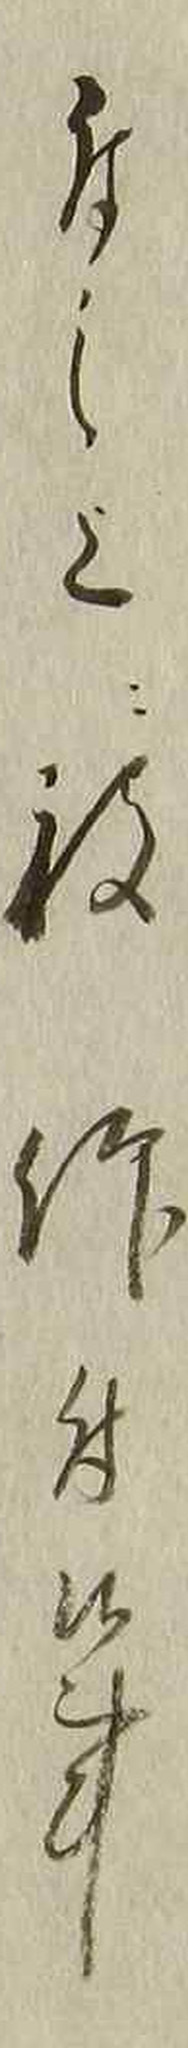付之上ニ被仰付候事
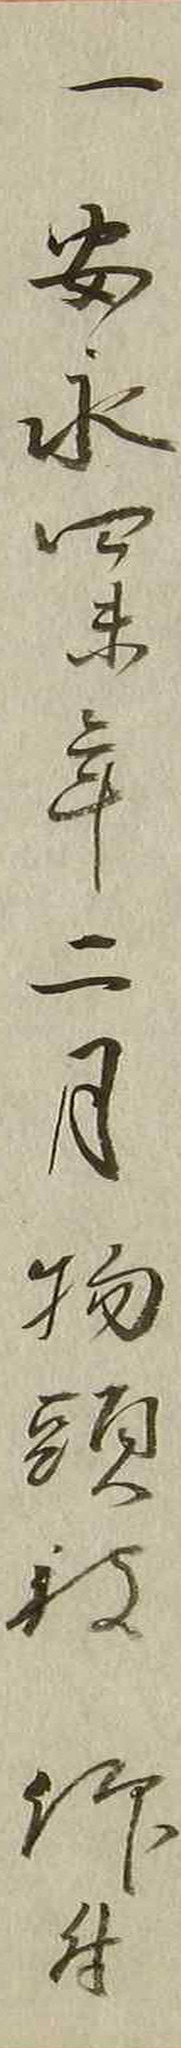一安永四未年二月物頭被仰付
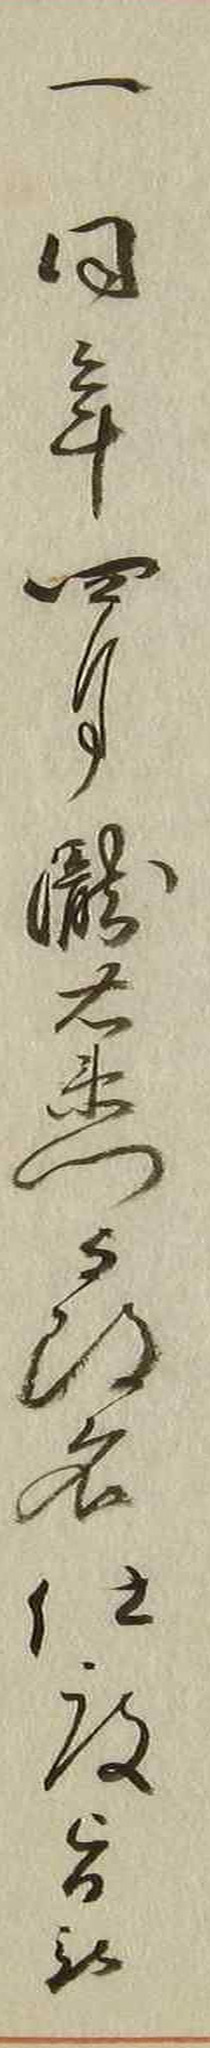一同年月四月滝右衛門与改名仕度旨被
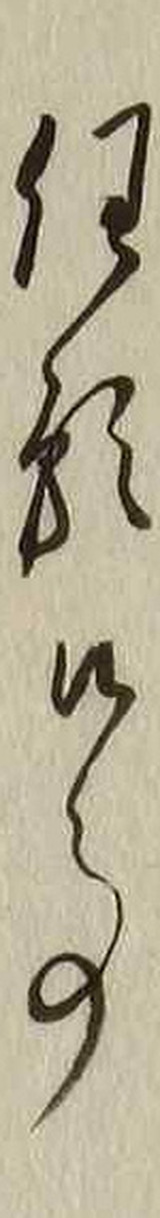任願候事
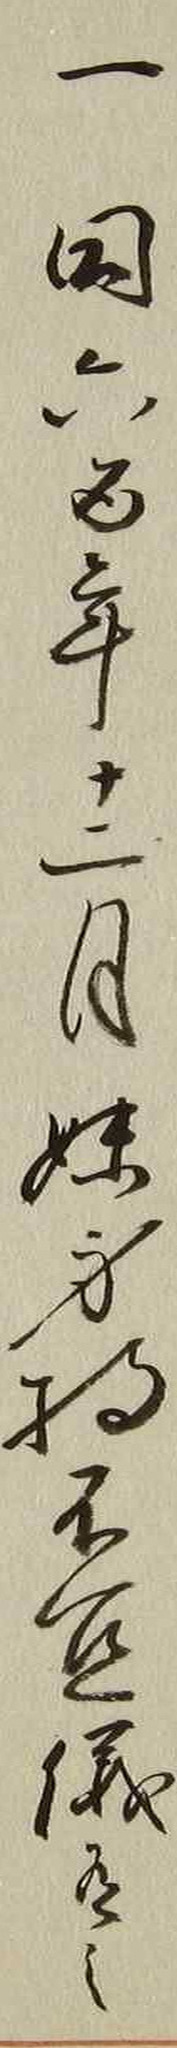一同六酉年十二月妹身持不宜儀有之
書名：諸士系譜　巻之122　よ之部5
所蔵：会津若松市立会津図書館
